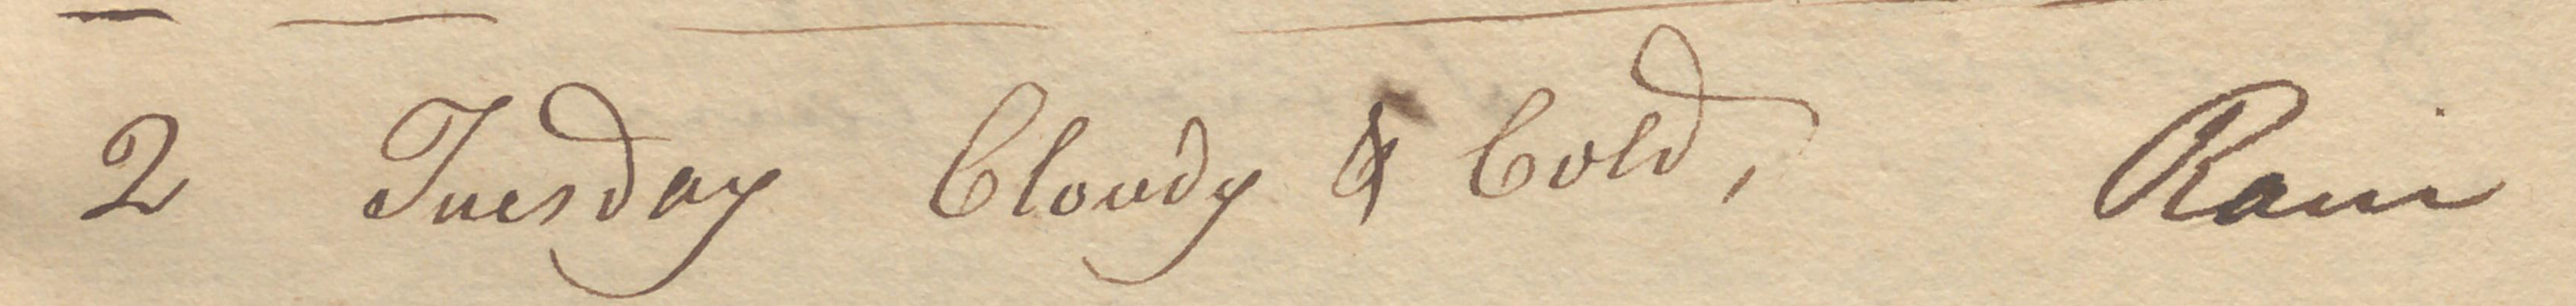2 Tuesday Cloudy & Cold, Rain
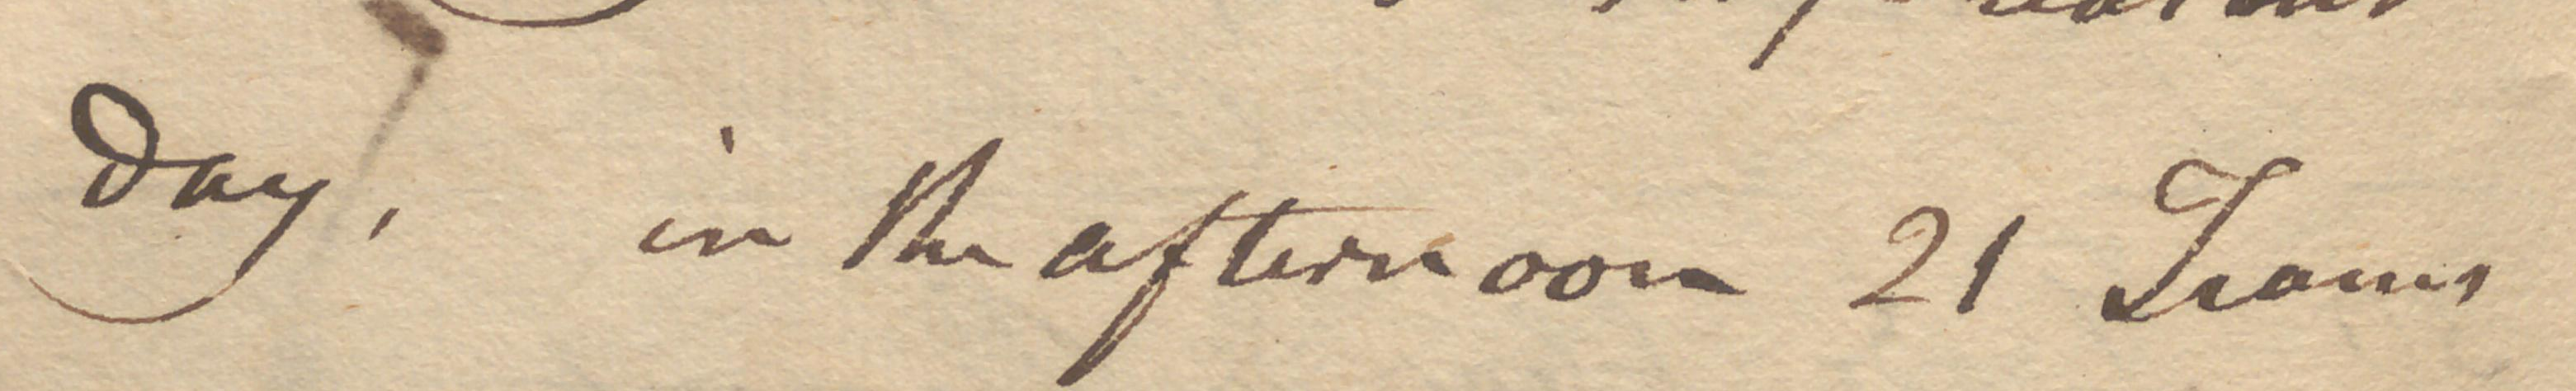day, in the afternoon 21 Teams
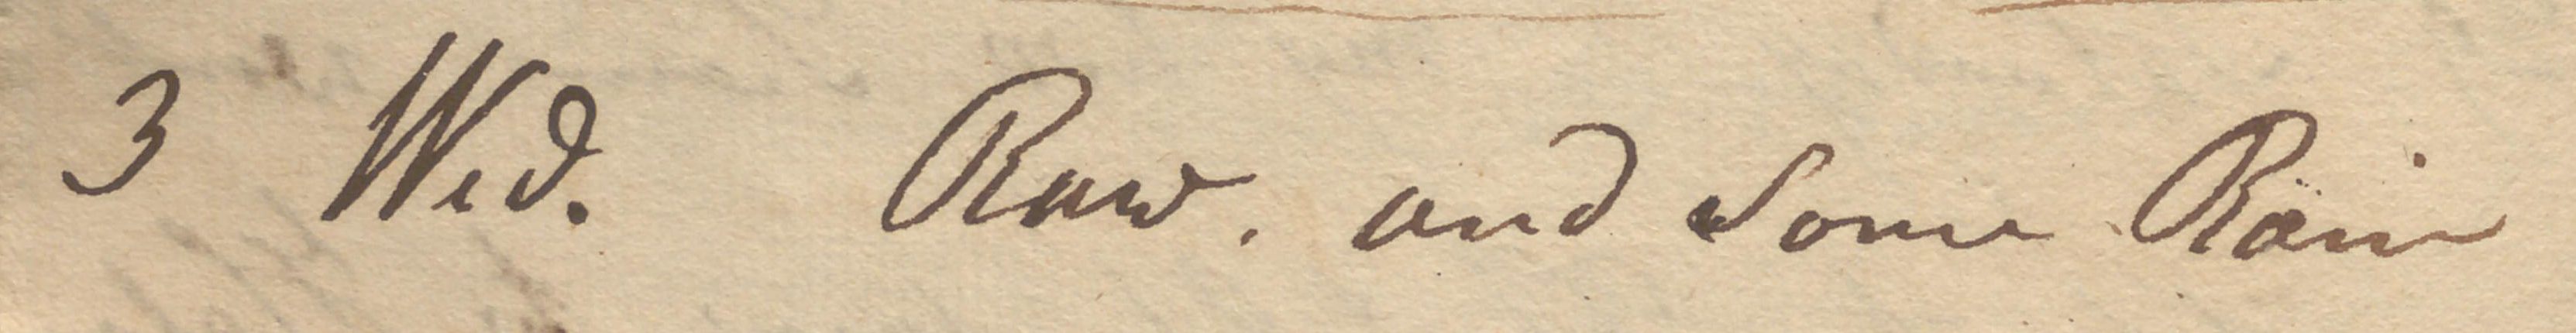3 Wed. Raw. and some Rain
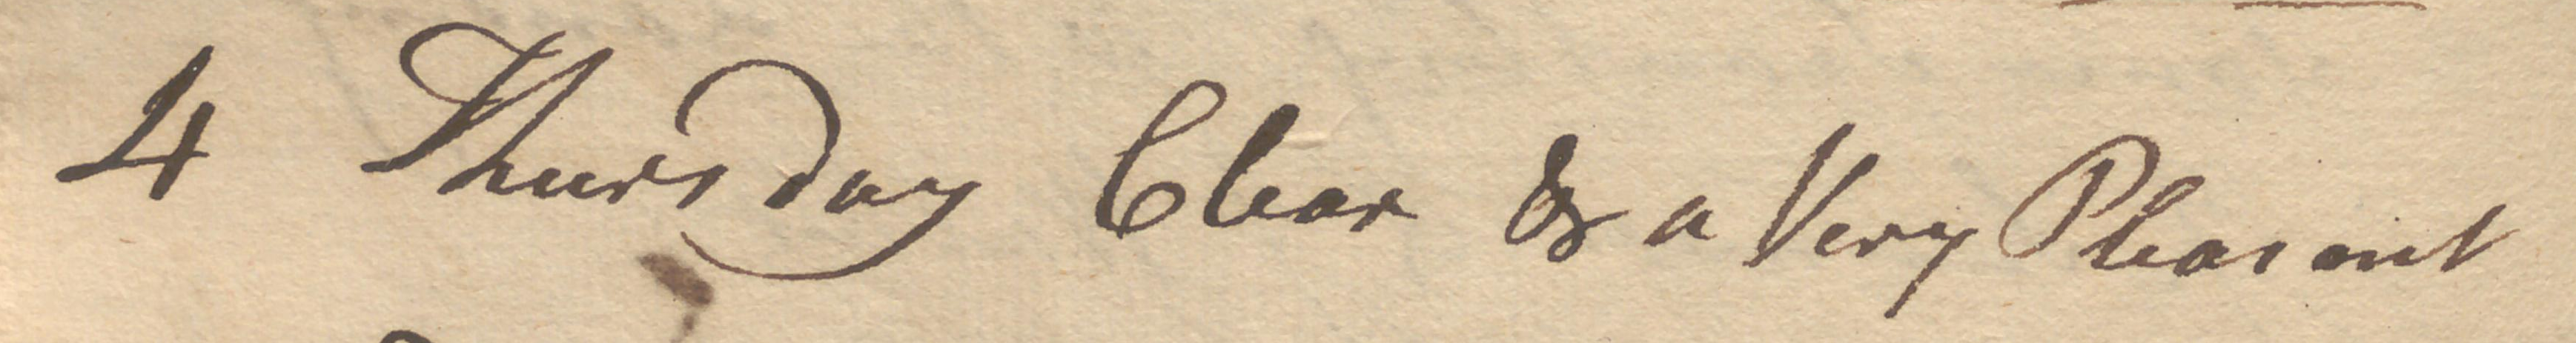4 Thursday Clear & a Very Pleasent
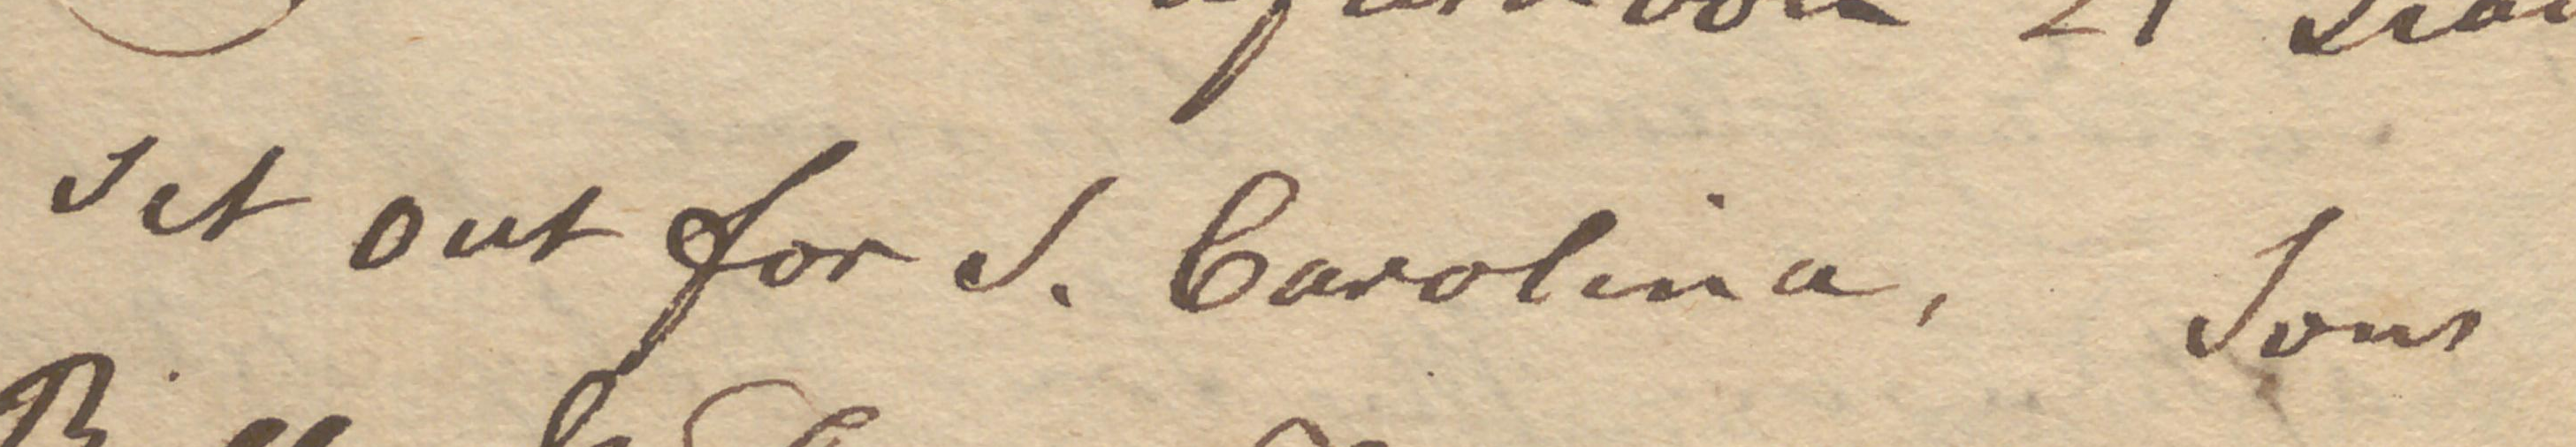set out for S. Carolina, Sons
